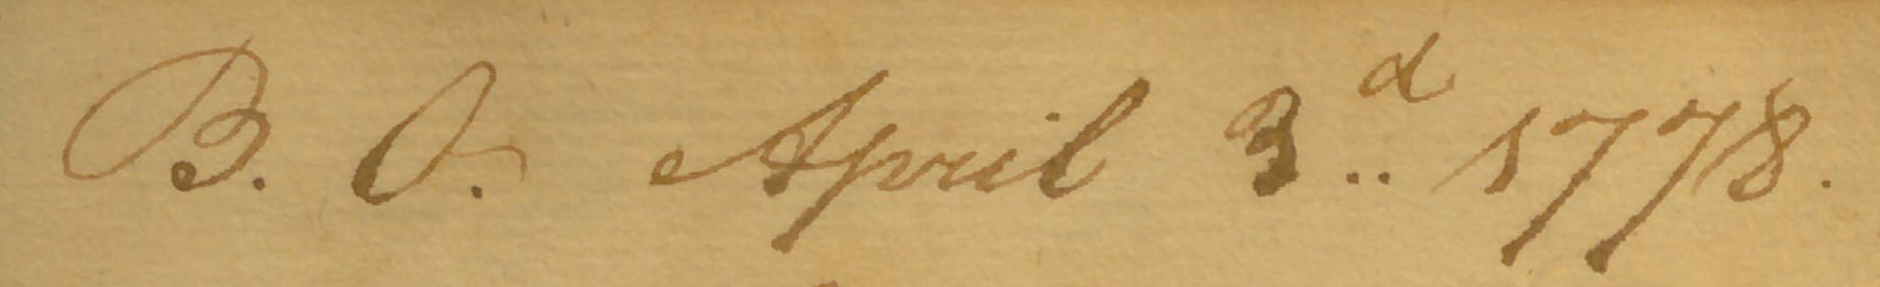B. O. April 3^d. 1778.
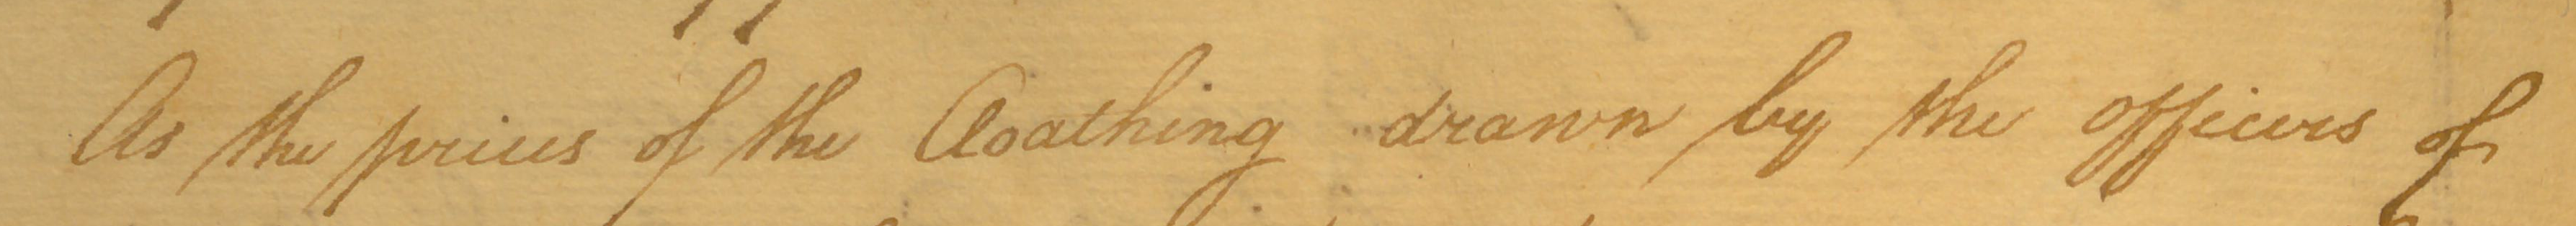As the prices of the Cloathing drawn by the officers of
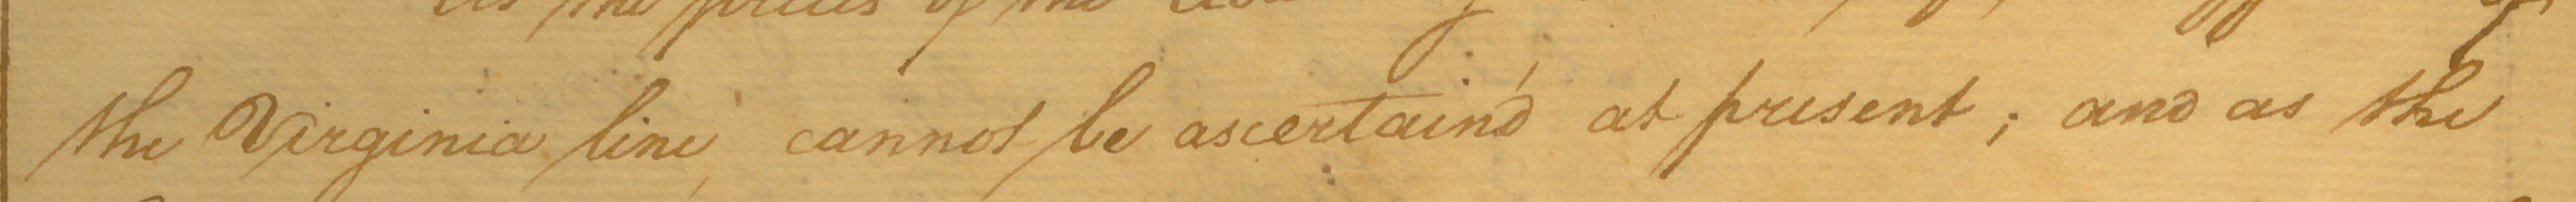the Virginia line cannot be ascertain'd at present; and as the
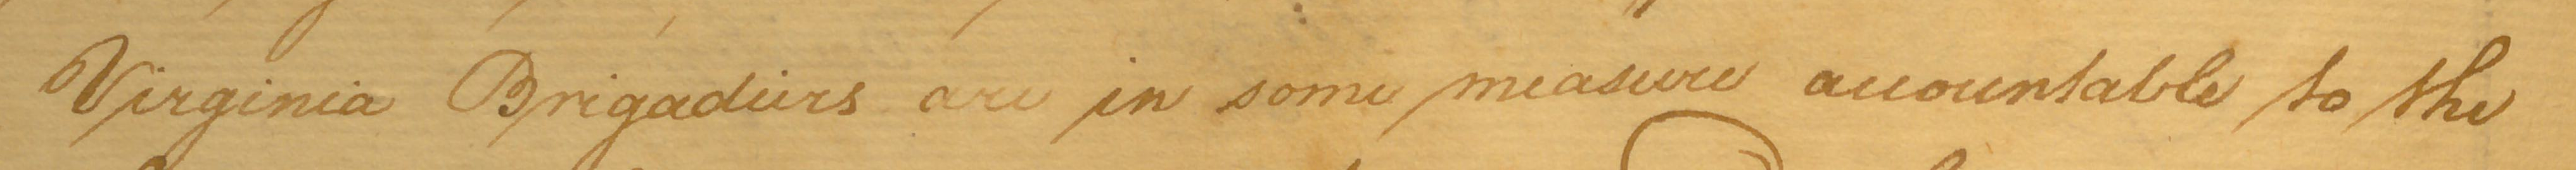Virginia Brigadiers are in some measure accountable to the
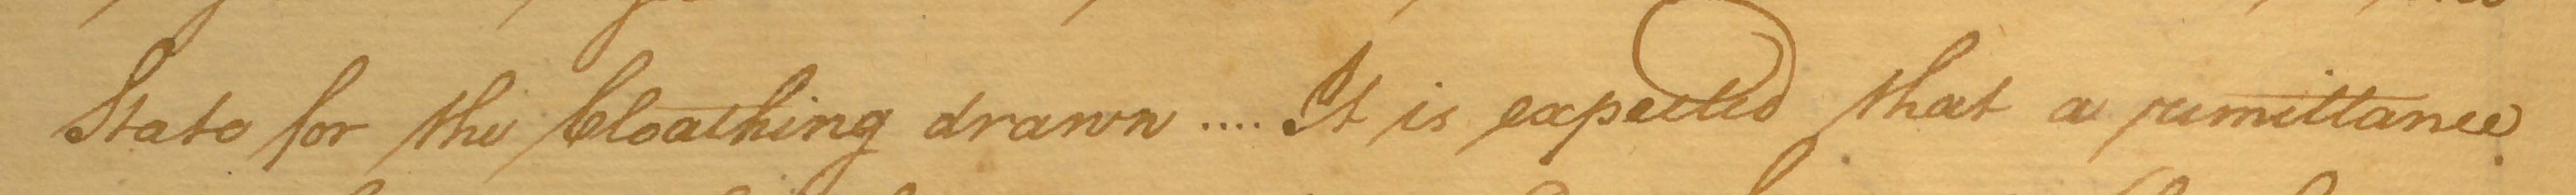State for the Cloathing drawn.... It is expected that a remittance
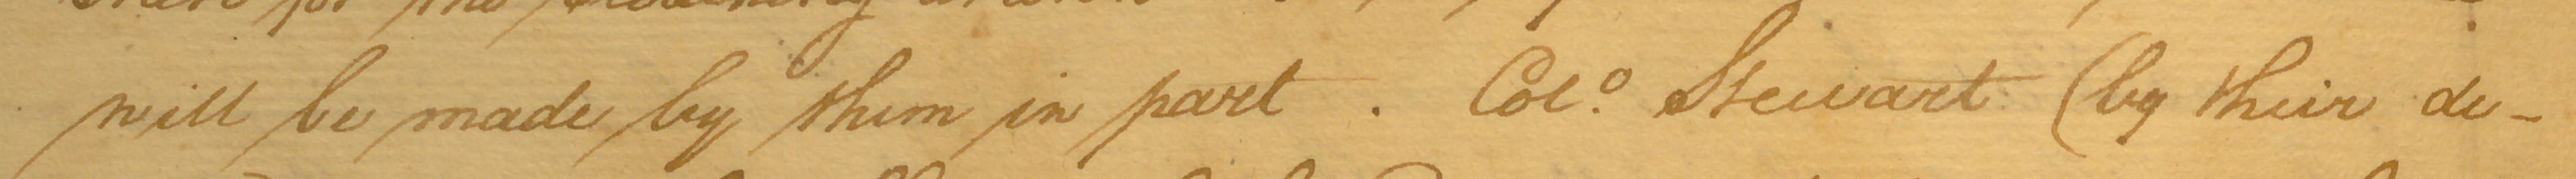will be made by them in part. Col^o. Stewart (by their de-
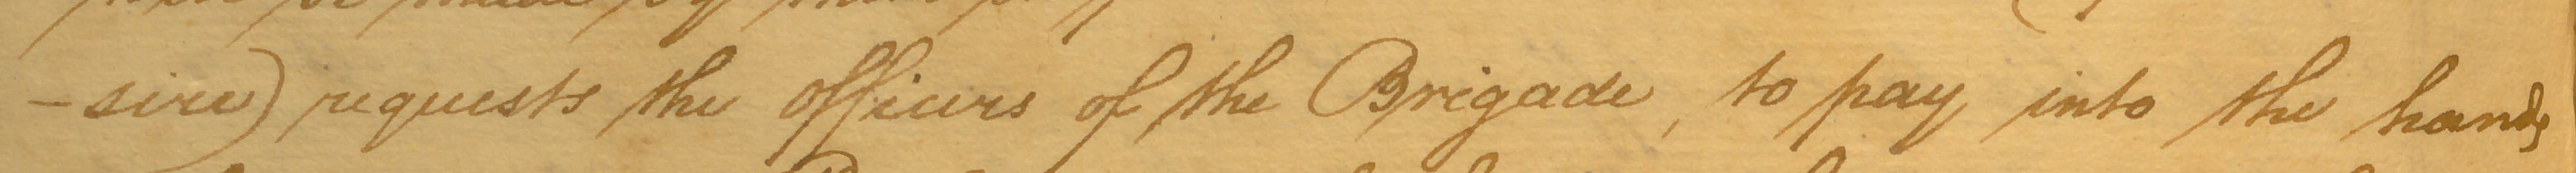-sire) requests the officers of the Brigade, to pay into the hands
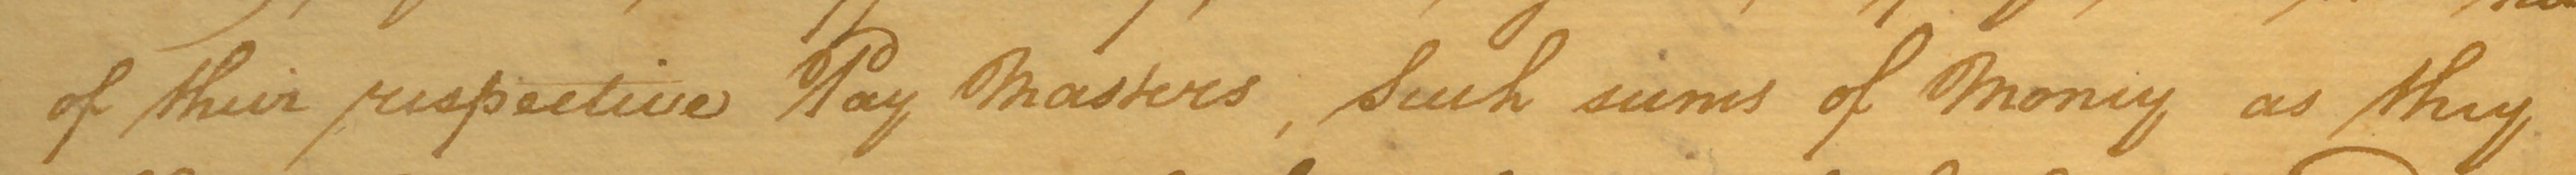of their repsective Pay Masters, such sums of money as they
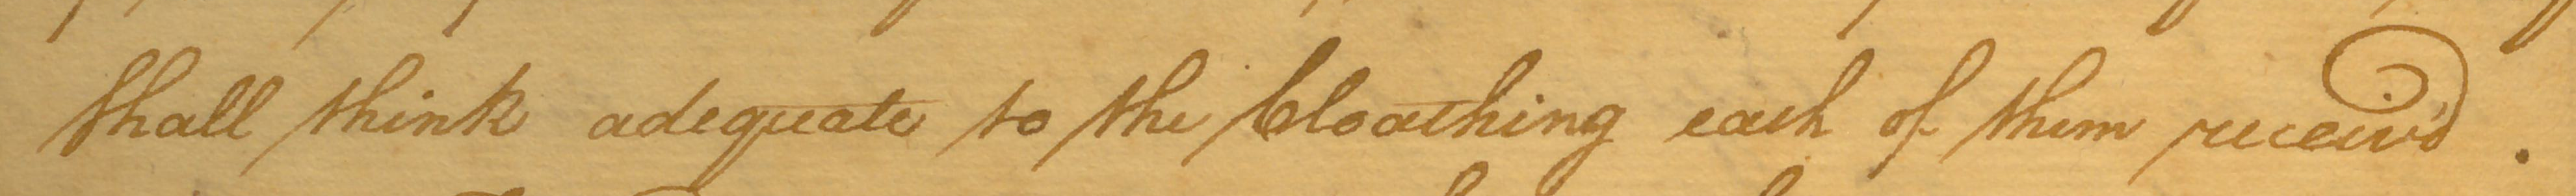shall think adequate to the Cloathing each of them receiv'd.
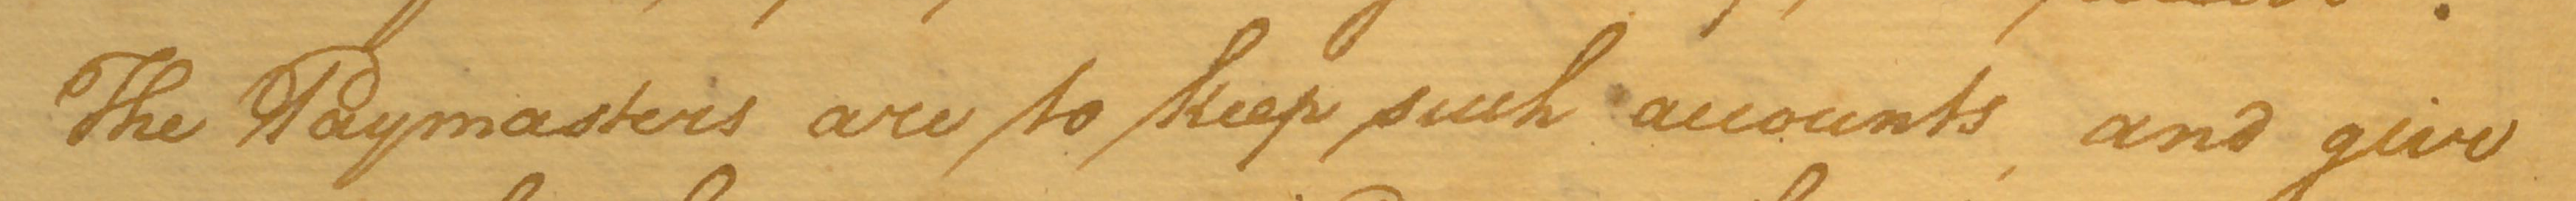The Paymasters are to keep such accounts and give
